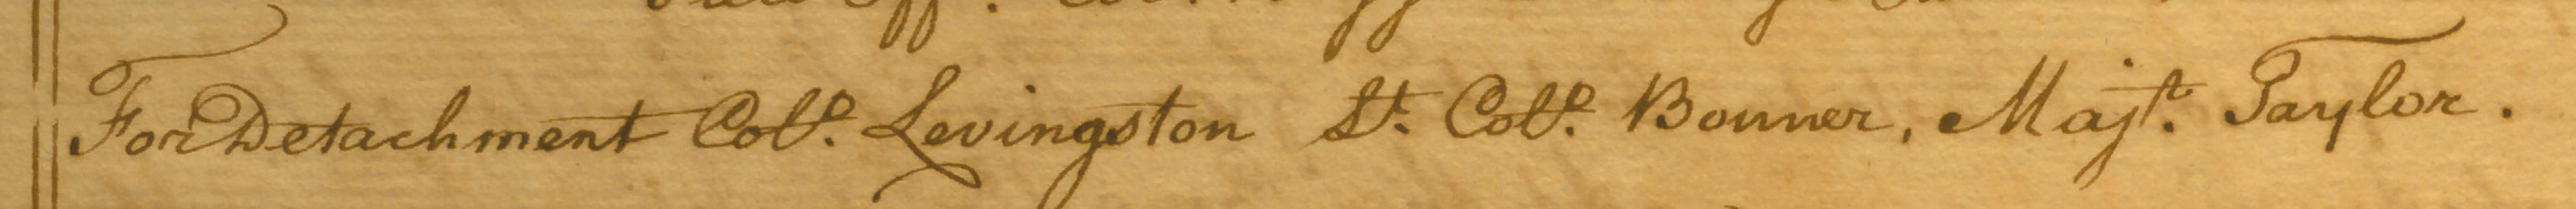For Detachment Col^o. Levingston L^t. Col^o. Bonner, Maj^r. Taylor.
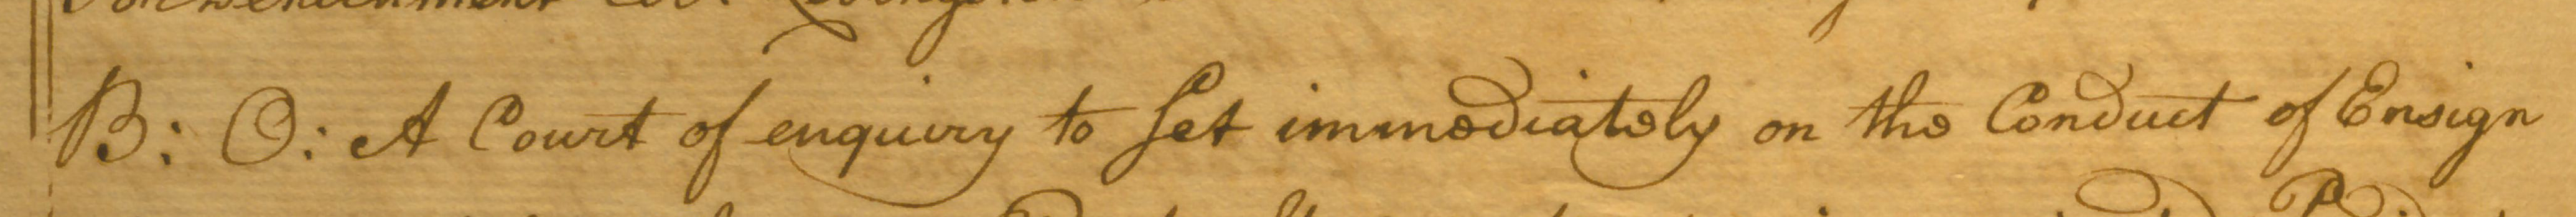B: O: A Court of enquiry to set immediately on the Conduct of Ensign
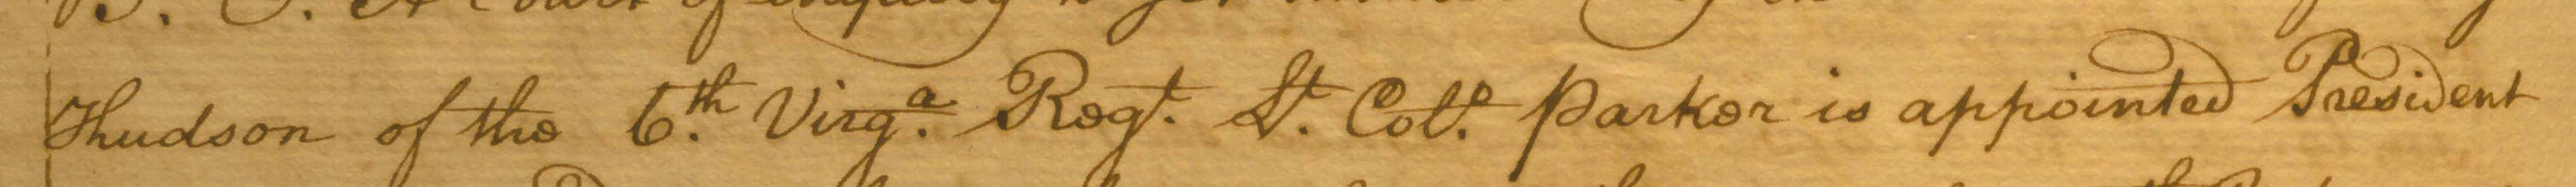Hudson of the 6^th. Virg^a. Reg^t. L^t. Col^o. Parker is appointed President
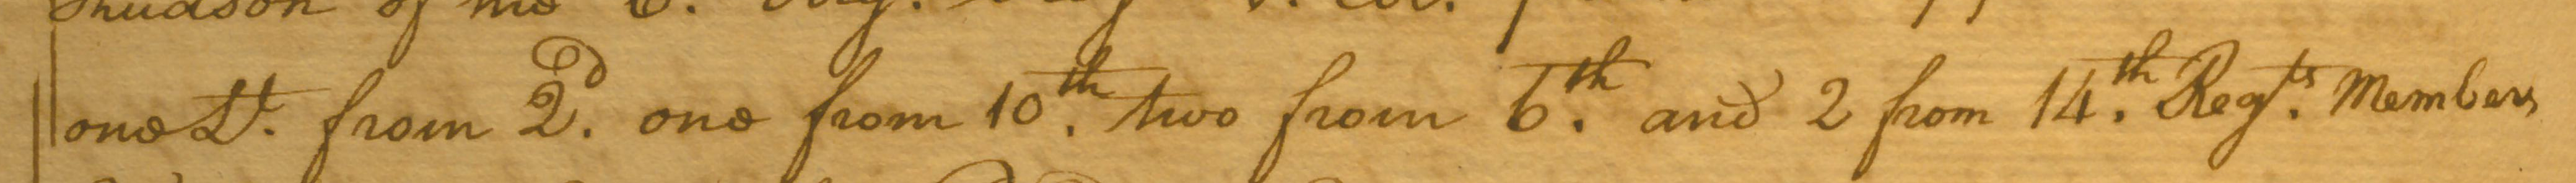one L^t. from 2^d. one from 10^th. two from 6^th. and 2 from 14^th. Reg^ts. Members
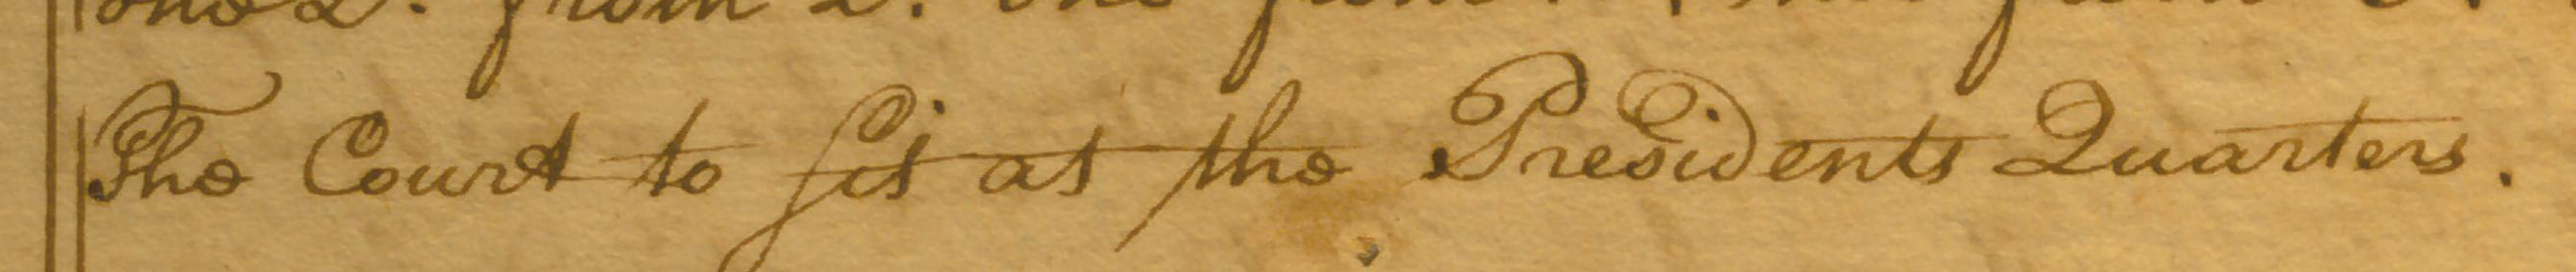The Court to sit as the Presidents Quarters.
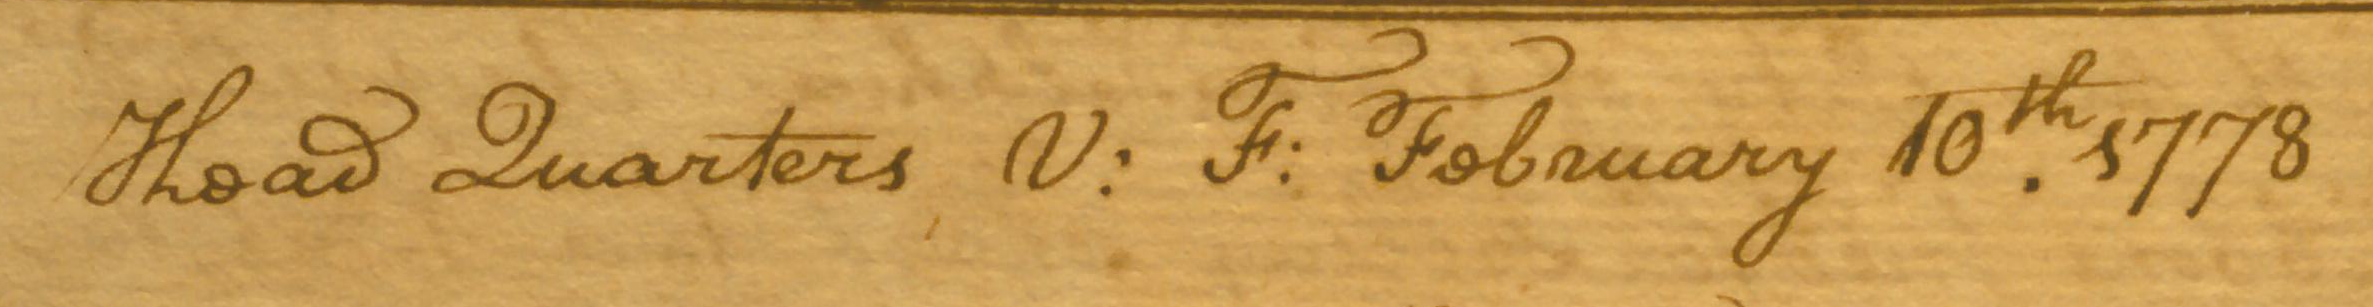Head Quarters V: F: February 10^th. 1778
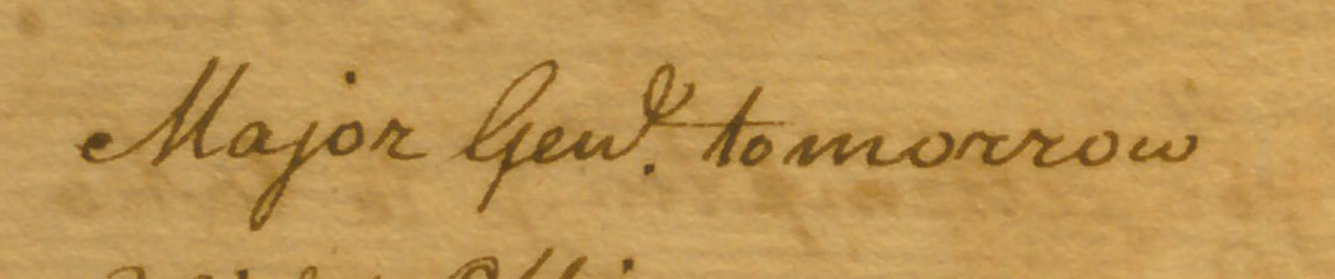Major Gen^l. tomorrow
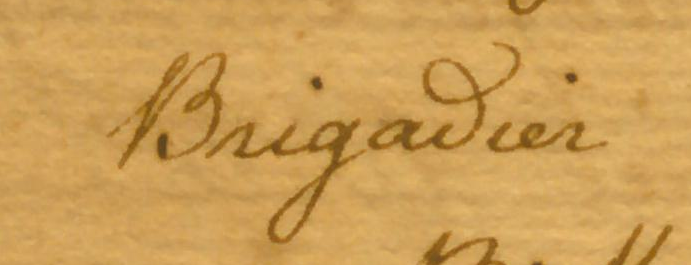Brigadier
